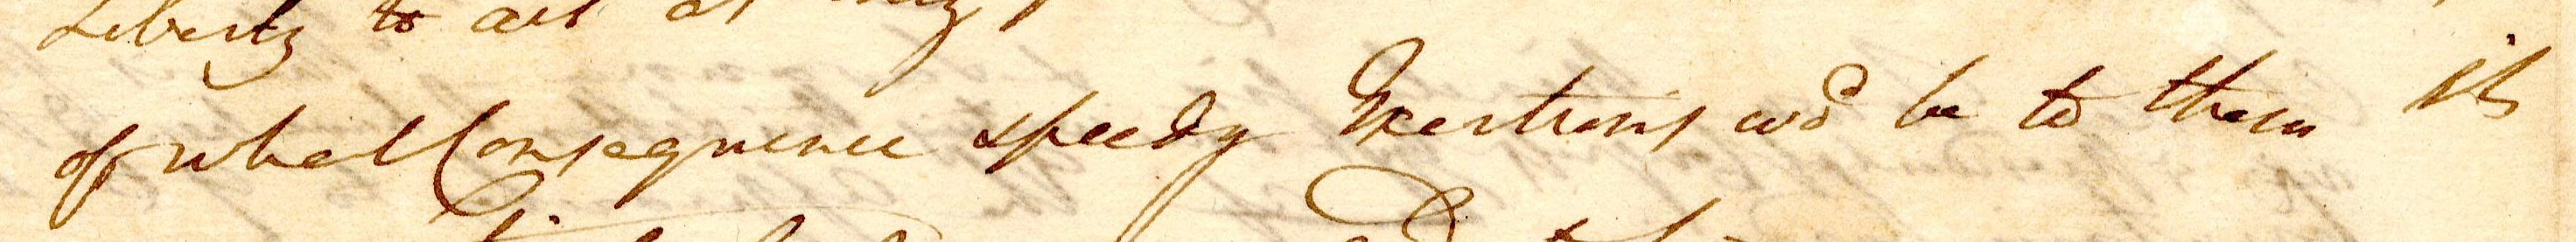of what Consequence speedy Exertions wo^d be to them it
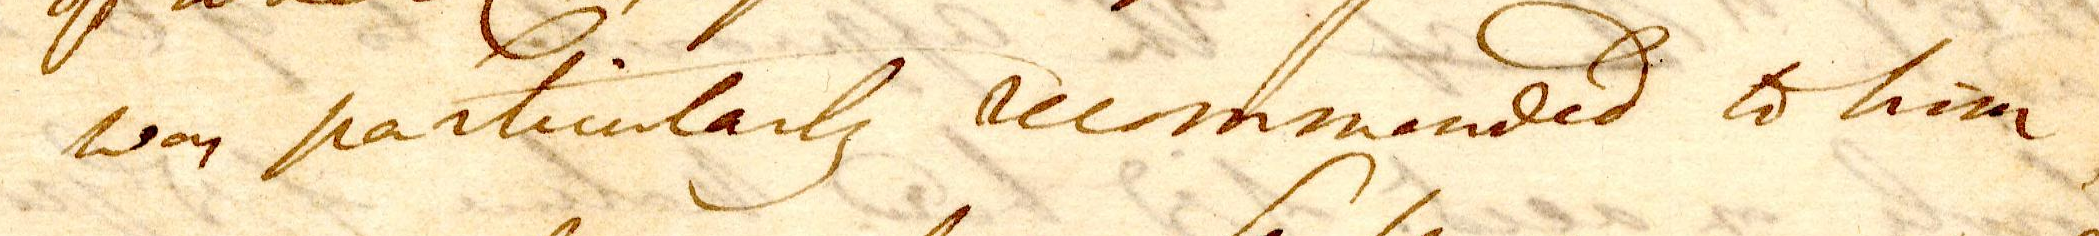was particularly recommended to him
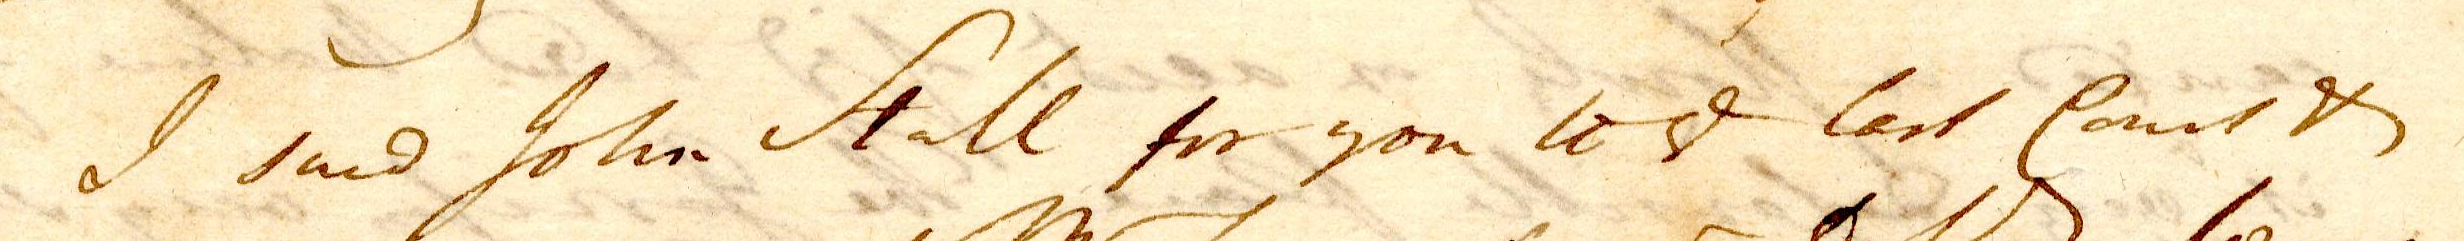I said John Stall for you to y^e last Court &
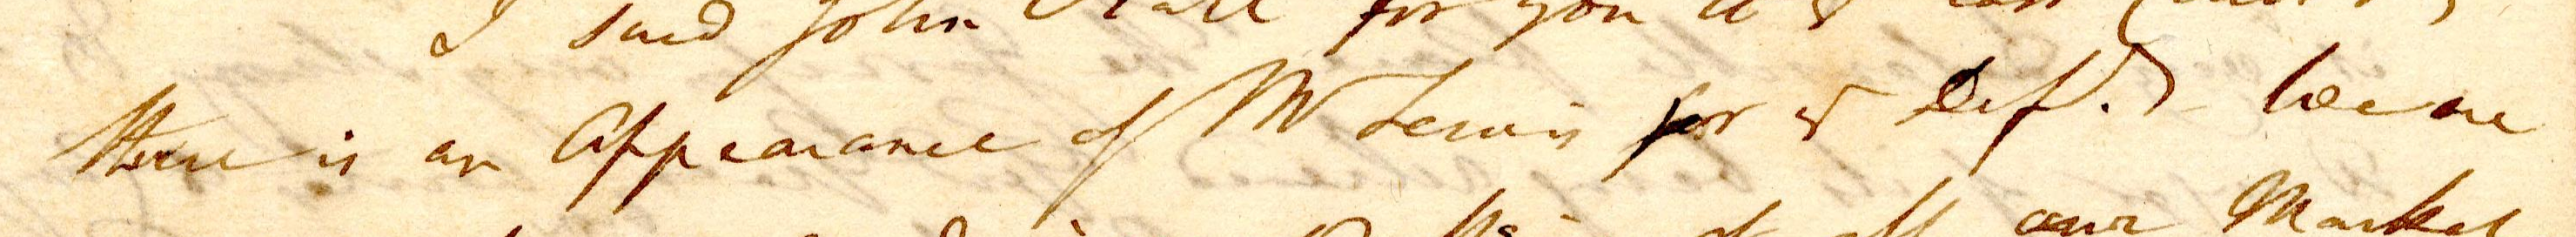there is an Appearance of M^r Lewis for y^e Dep^t. become
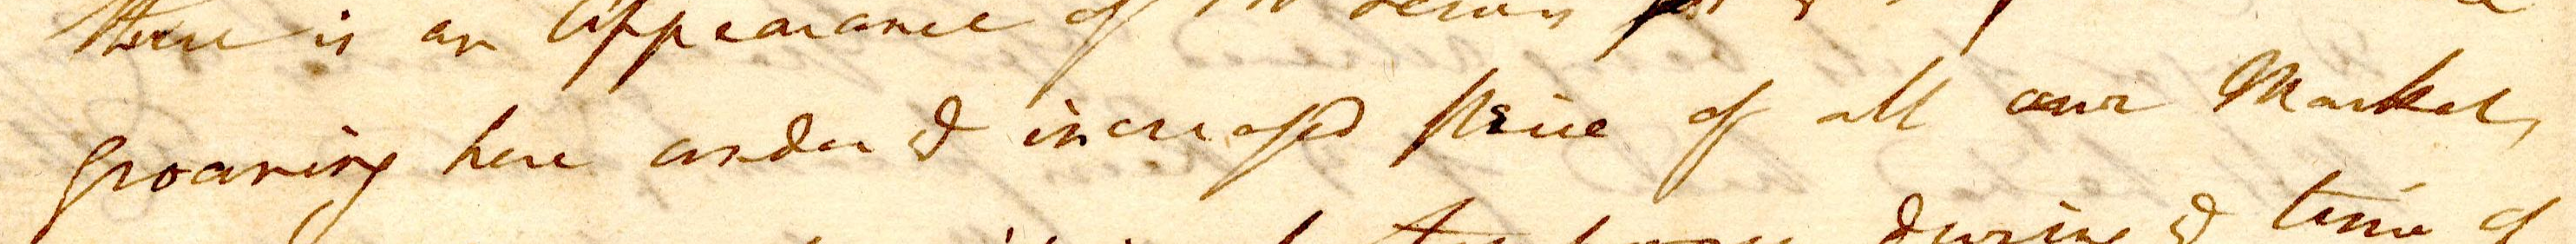groaning here under I increased price of all our Market
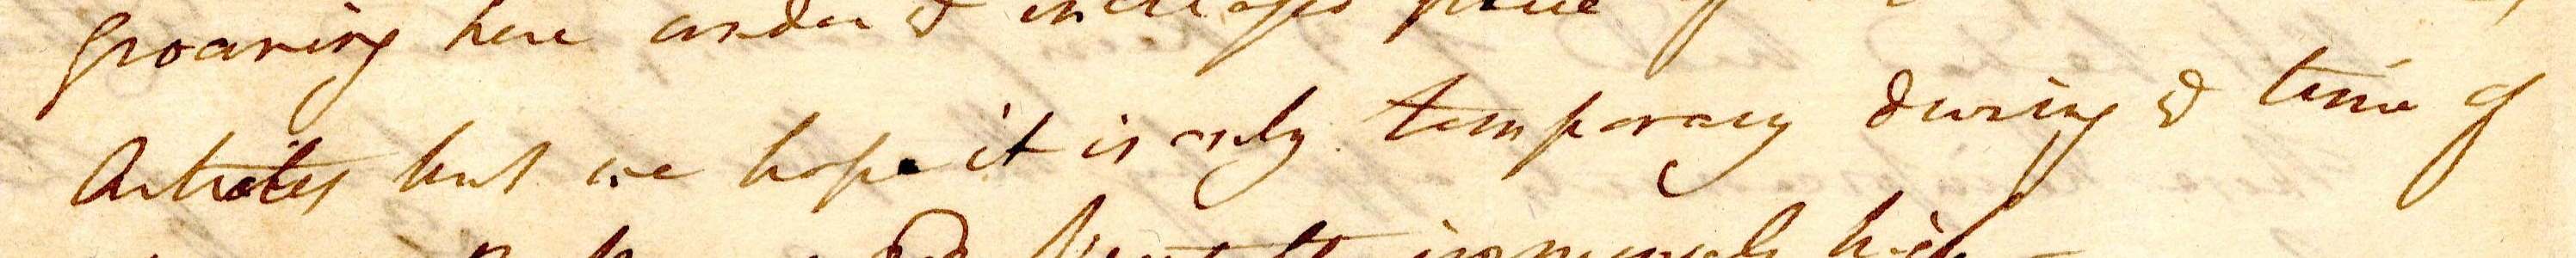Articles but we hope it is only temporary during y^e time of
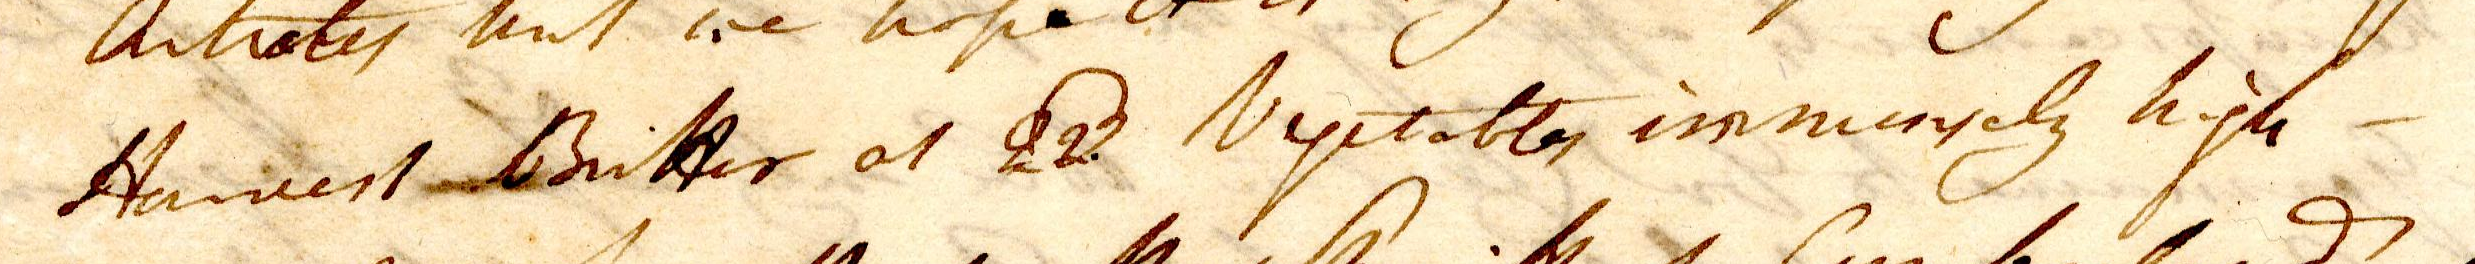Harriet Butler at 22d Vegetables immensely high
